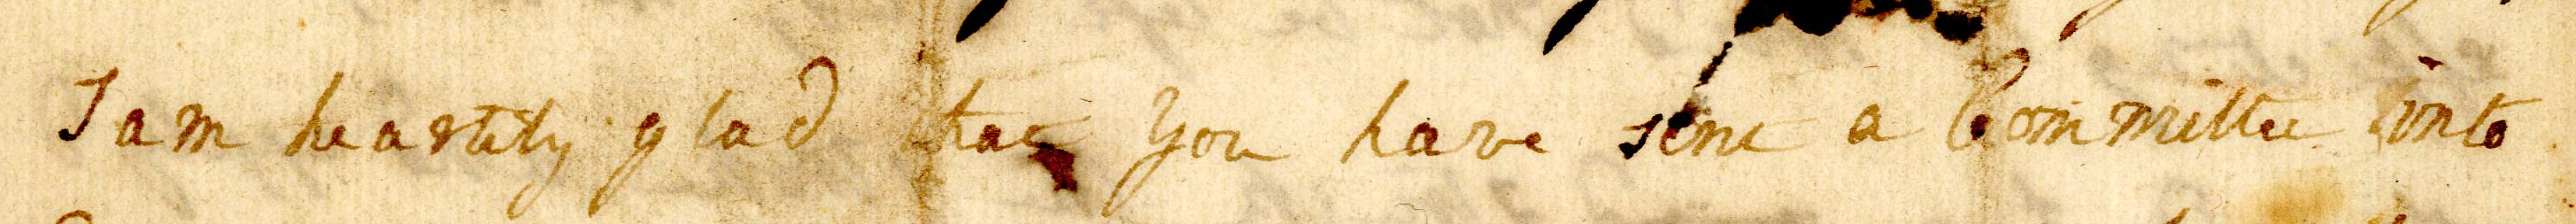I am heartily glad that you have sent a Committee into
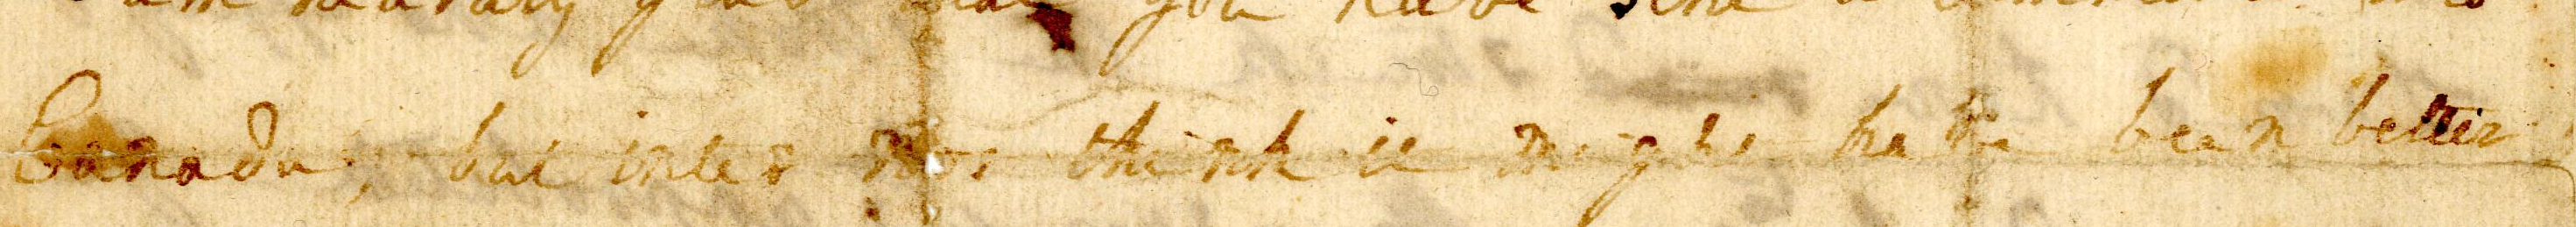Canada; but inter [___] think it right he feel better
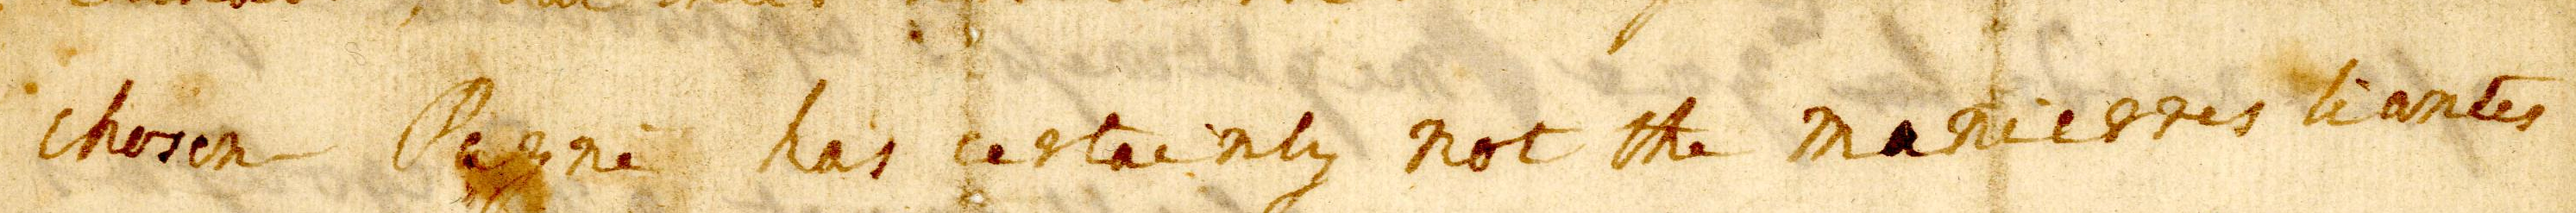chosen Payne has certainly not the manierres liantes
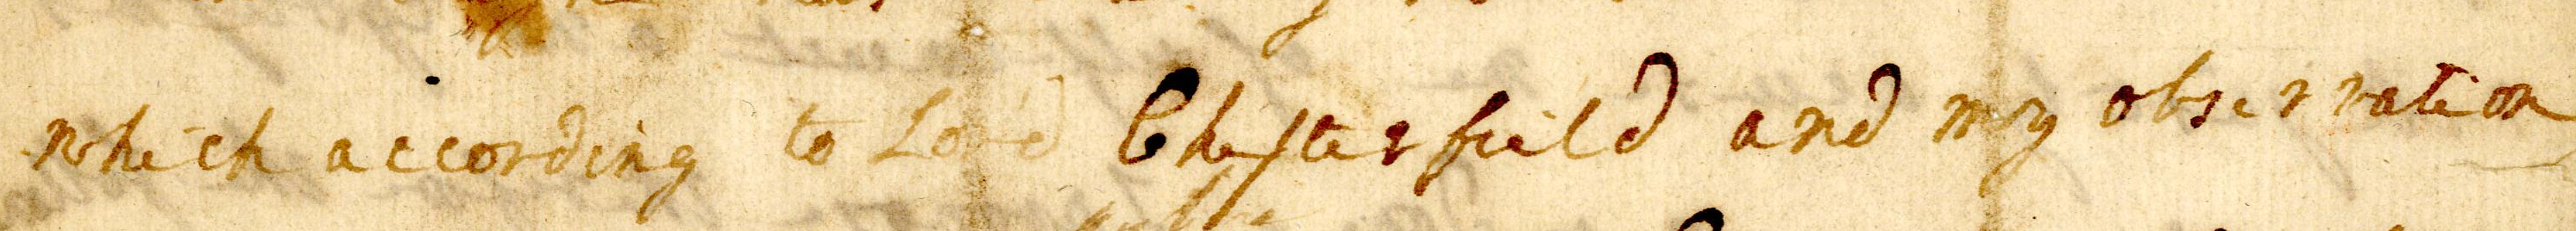which according to Lord Chesterfield and my observation
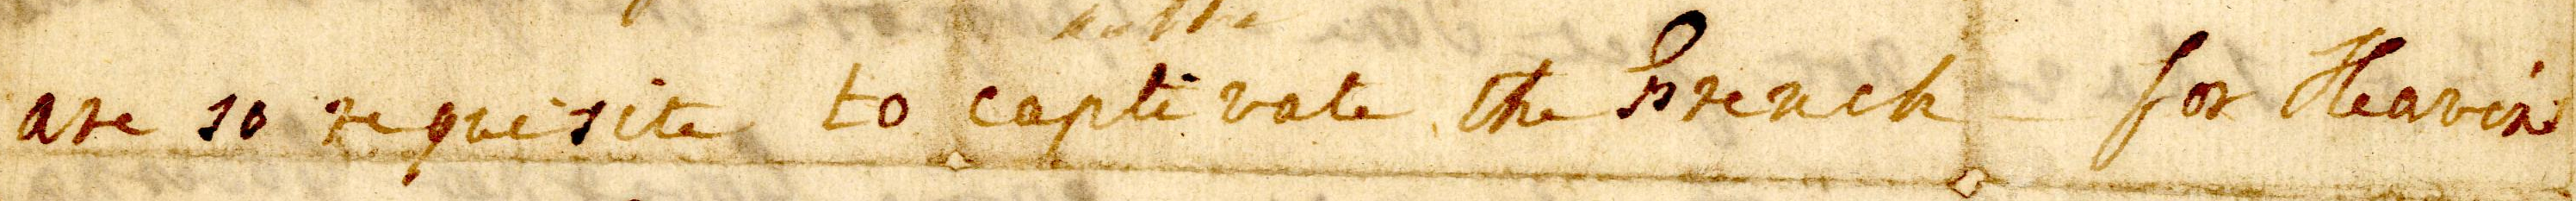are so requisite to captivate the French for Heaven's
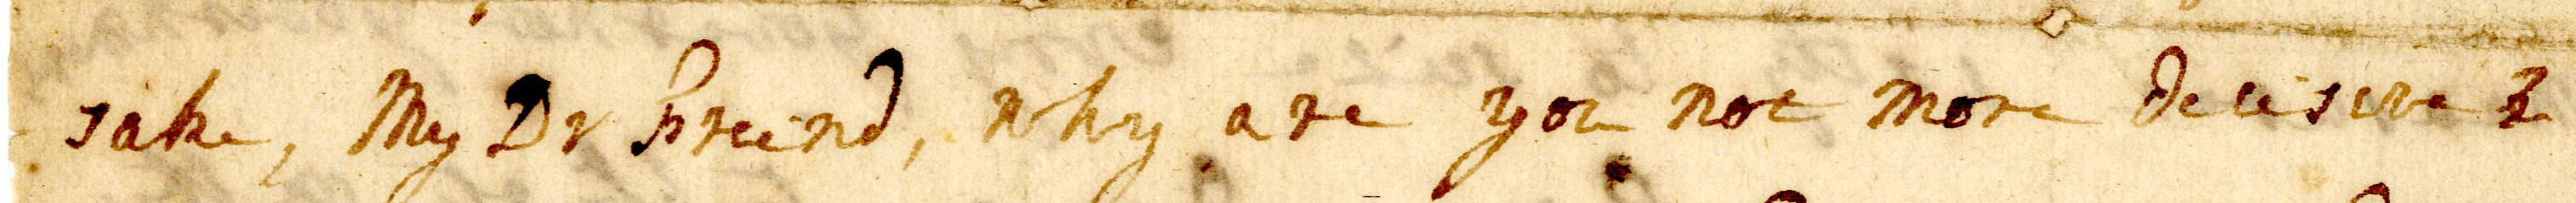sake, My Dr Friend, why are you not more decisive to
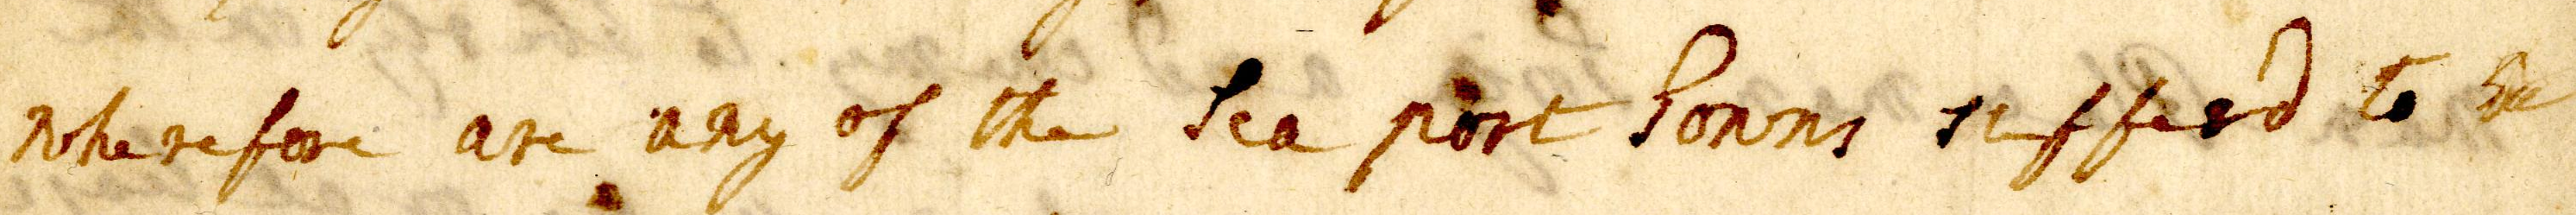wherefore are any of the Sea port Towns suffer'd to be
